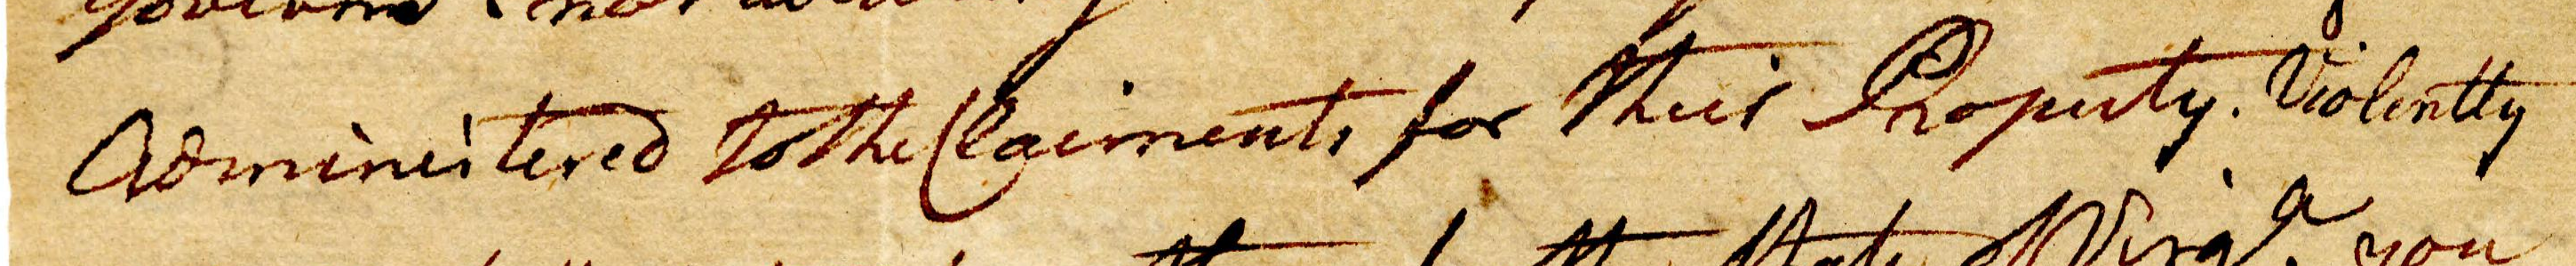Administered to the Claiments for their Property. Violently
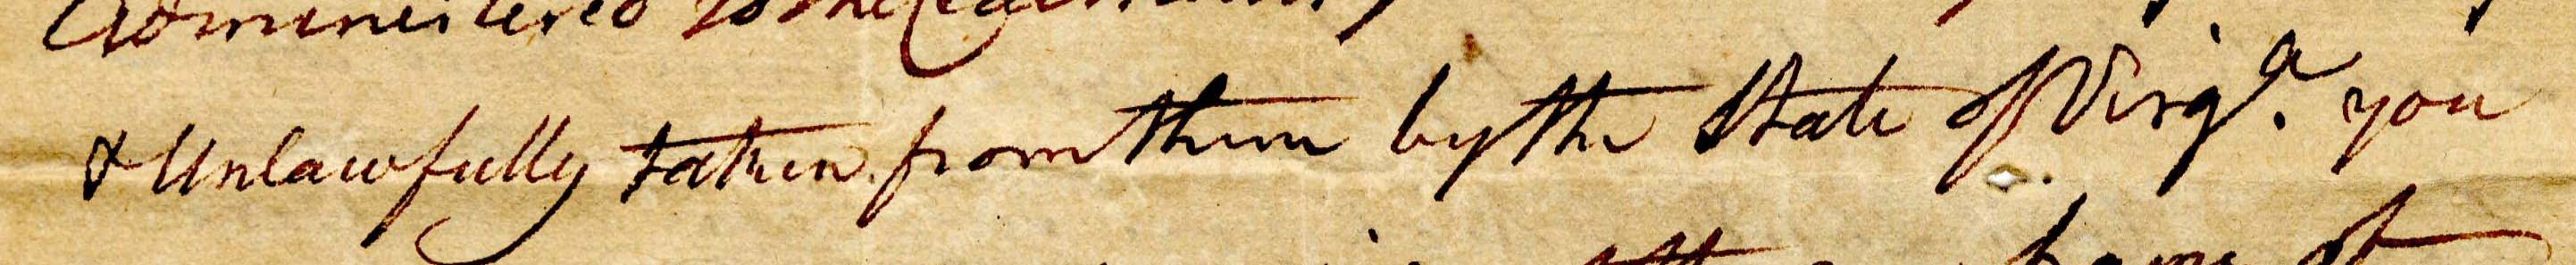& Unlawfully taken from them by the State of Virg^a. you
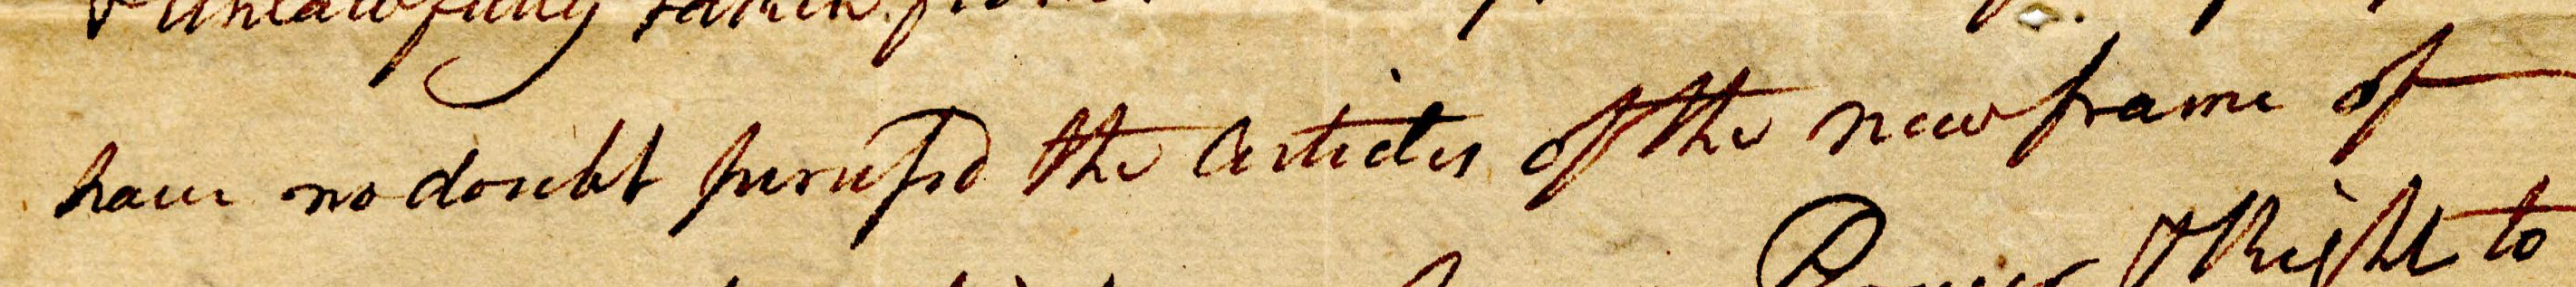have no doubt peruse'd the Articles of the new frame of
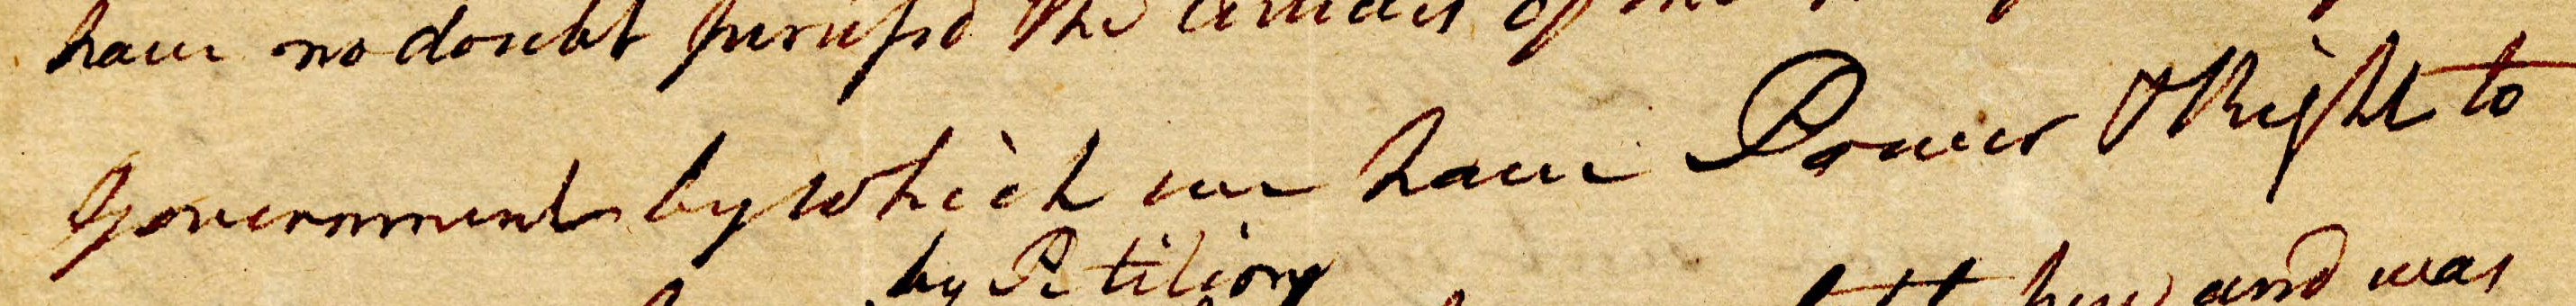Government by which we have Power & Right to
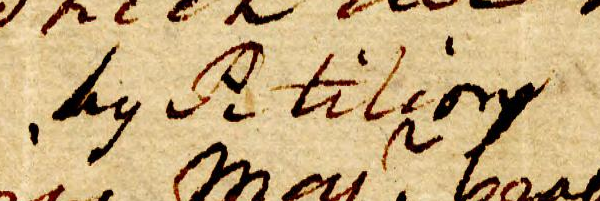by Petition
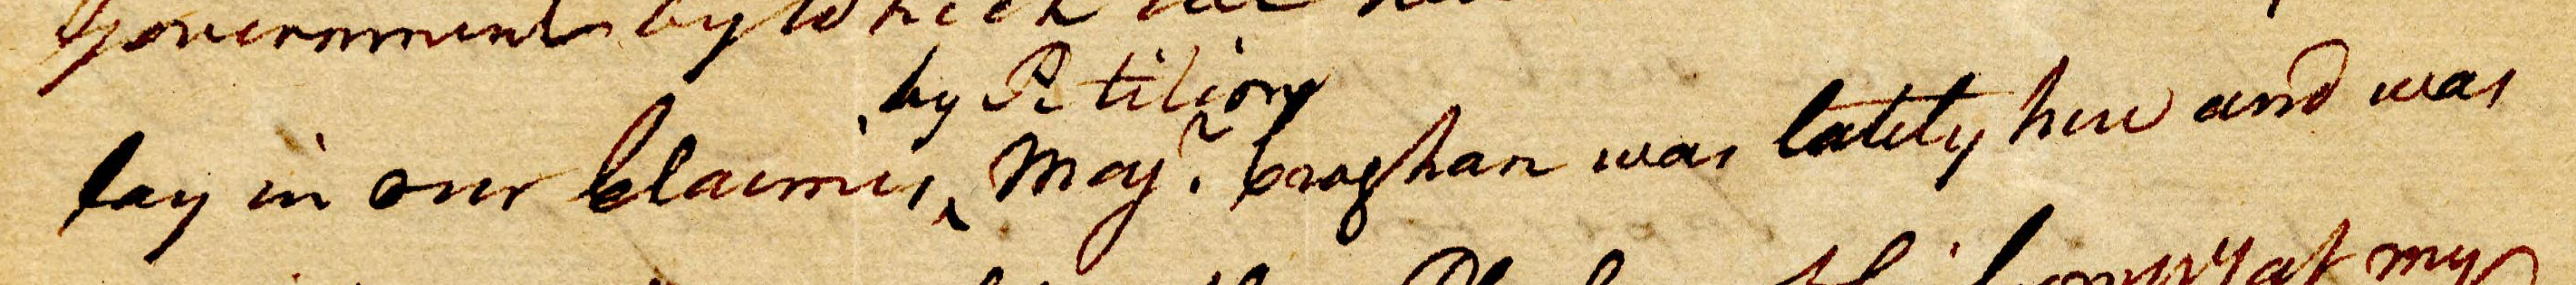lay in our Claimes ^ Maj^r. Croghan was lately here and was
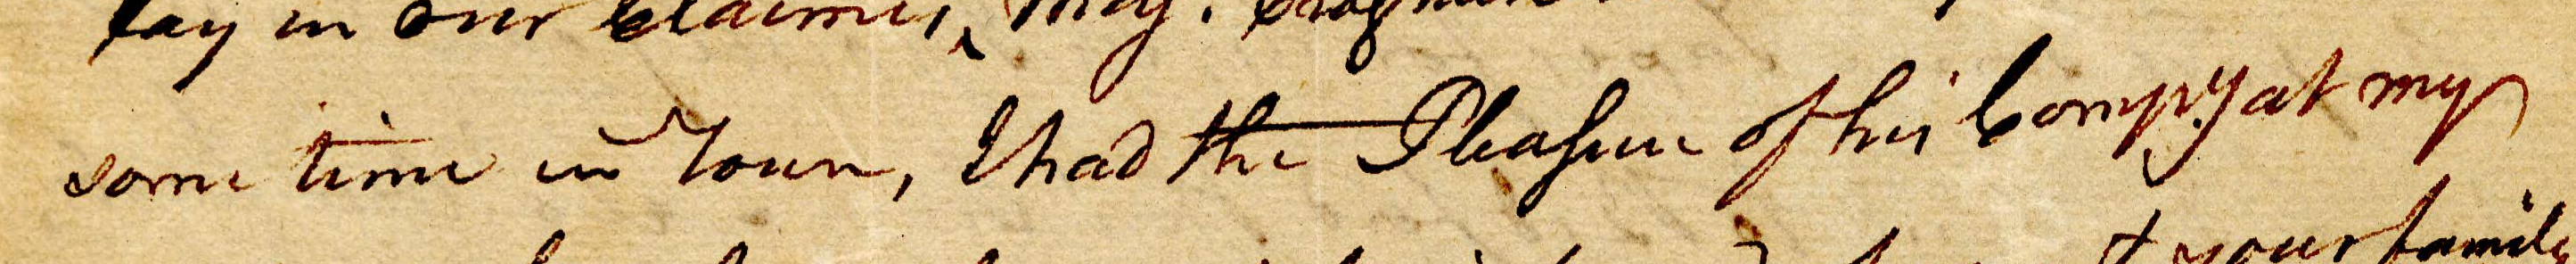some time in town, I had the Pleasure of his Comp^y. at my
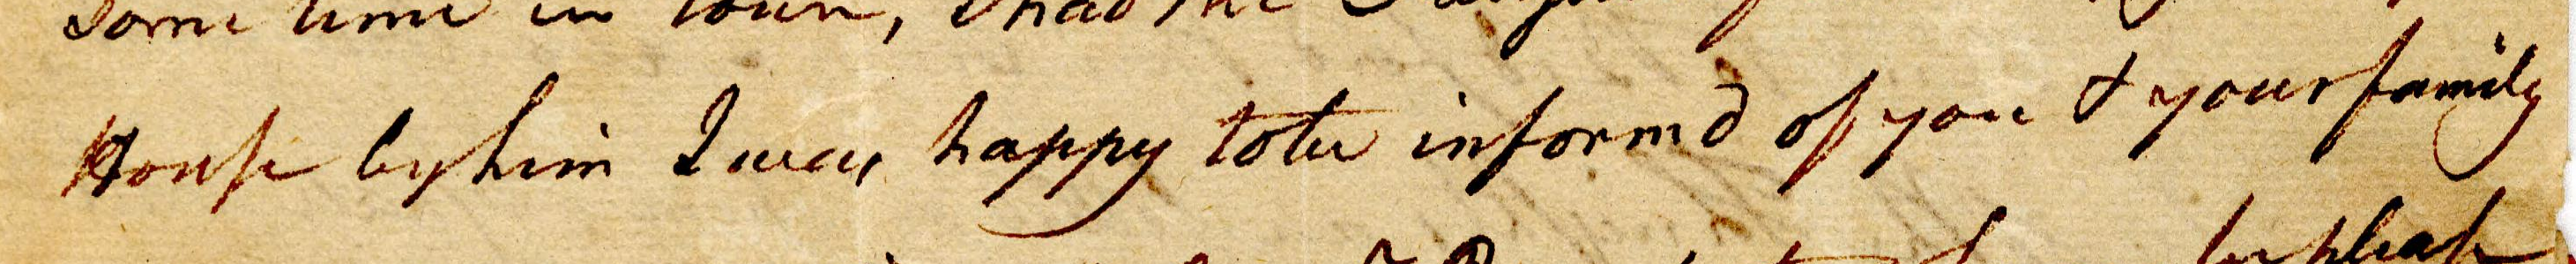House by him I was happy to be inform'd of you & your family
